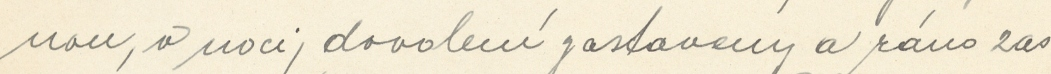nou, v noci, dovolené zastaveny a ráno zas
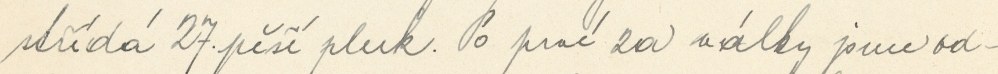střídá 27. pěší pluk. Po prvé za války jsme od-
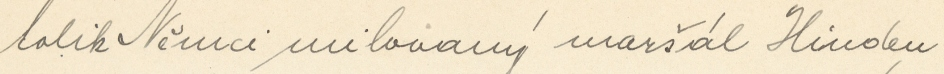tolik Němci milovaný maršál Hinden-
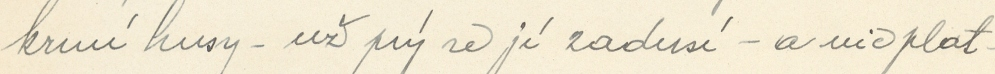krmí husy - už prý se jí zadusí - a nic plat-
